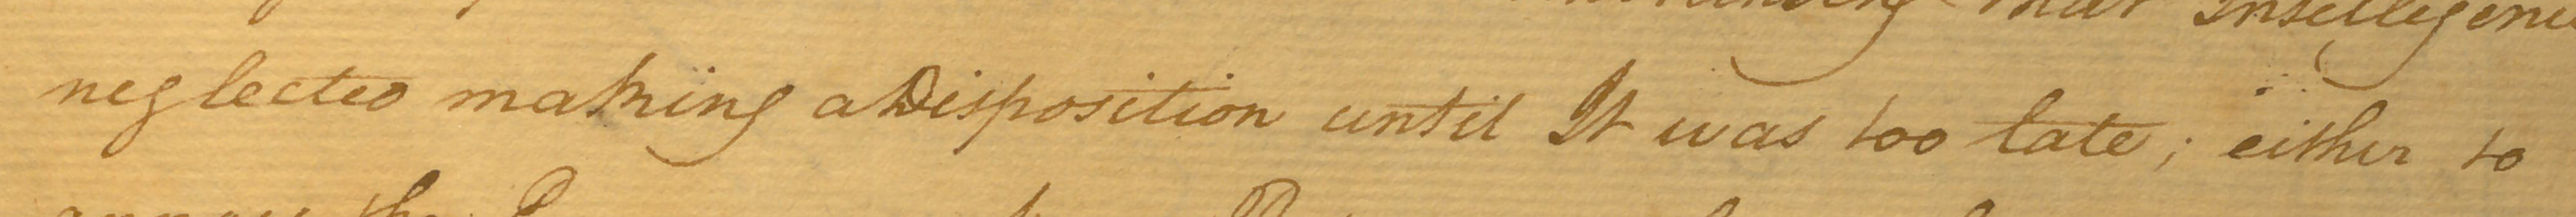neglected making a Disposition until It was too late; either to
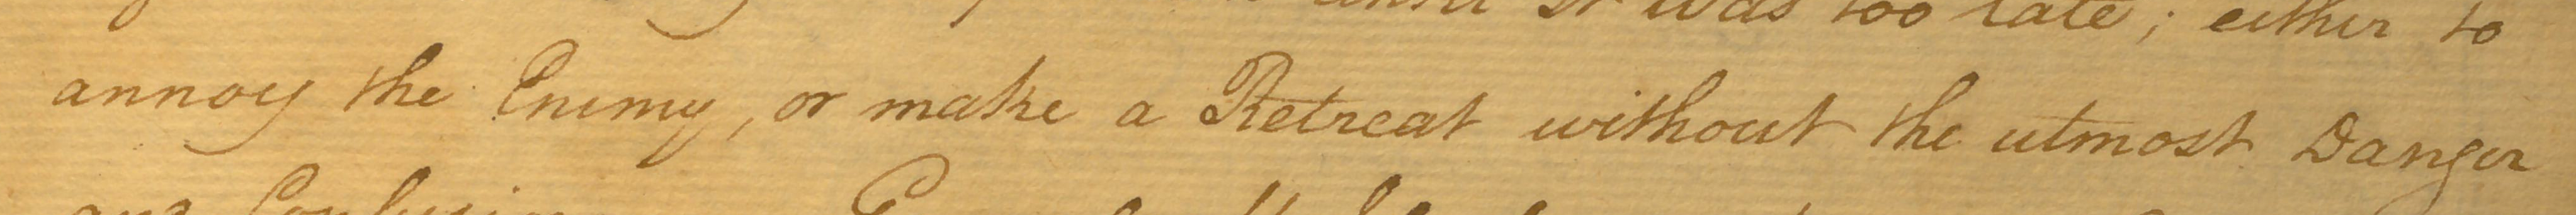annoy the Enemy, or make a Retreat without the utmost Danger
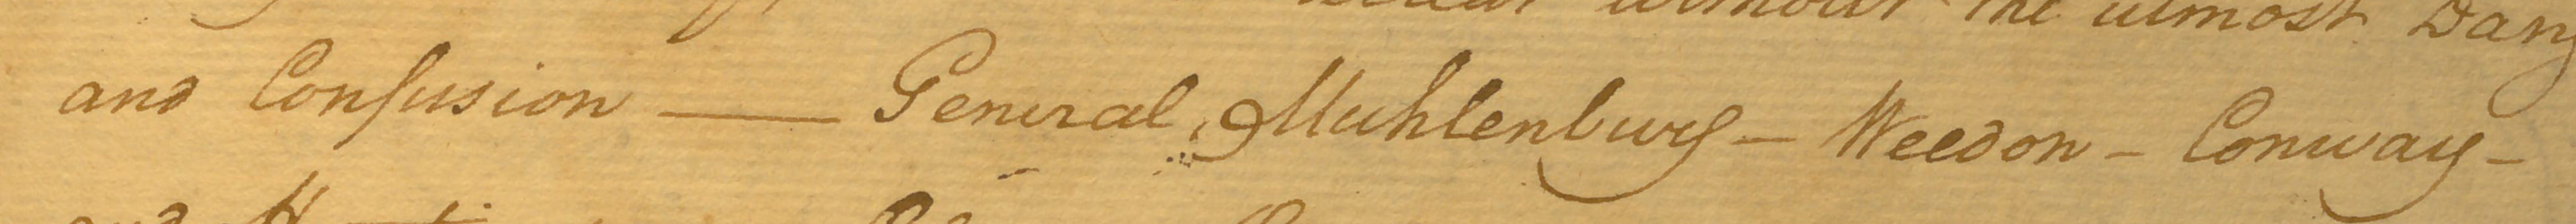and Confusion- General Muhlenburg- Weedon- Conway-
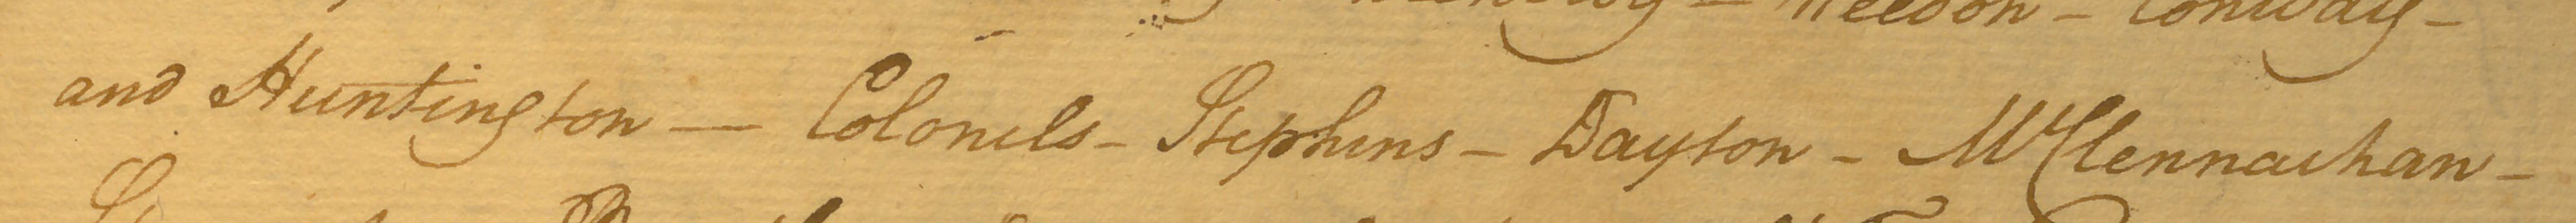and Huntington- Colonels- Stephens- Dayton- M^cClennachan-
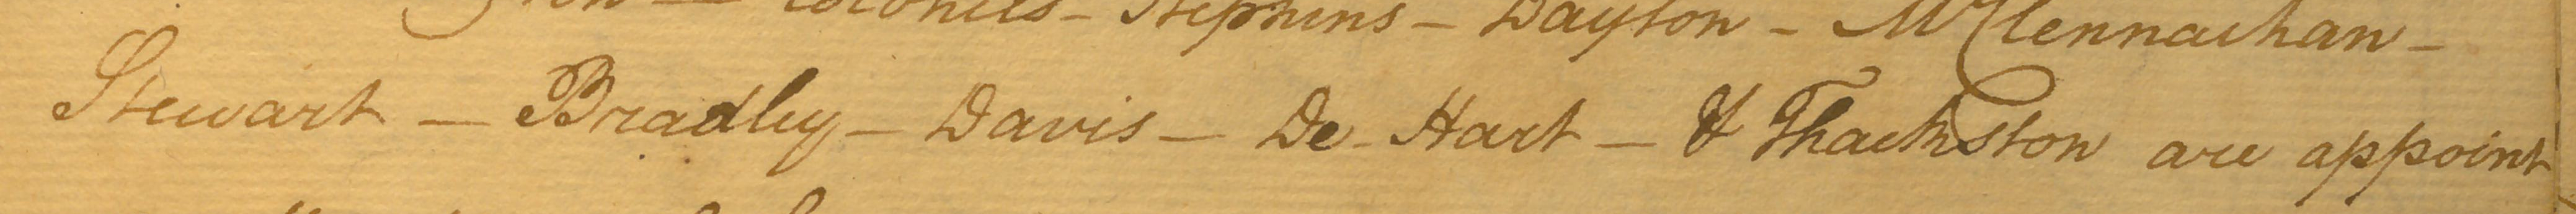Stewart- Bradley- Davis- De-Hart- & Thackston are appoint
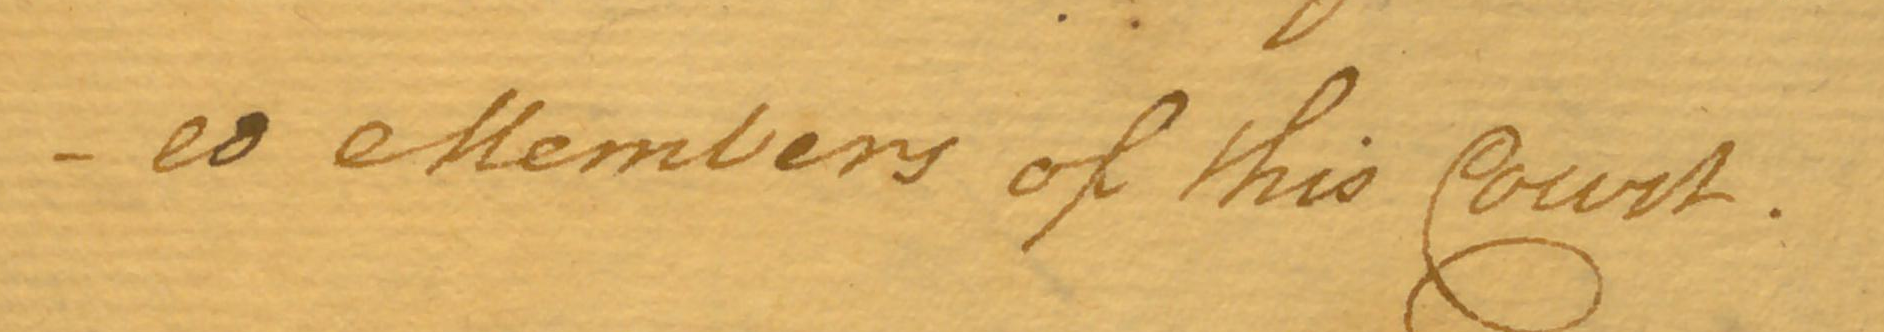-ed Members of this Court.
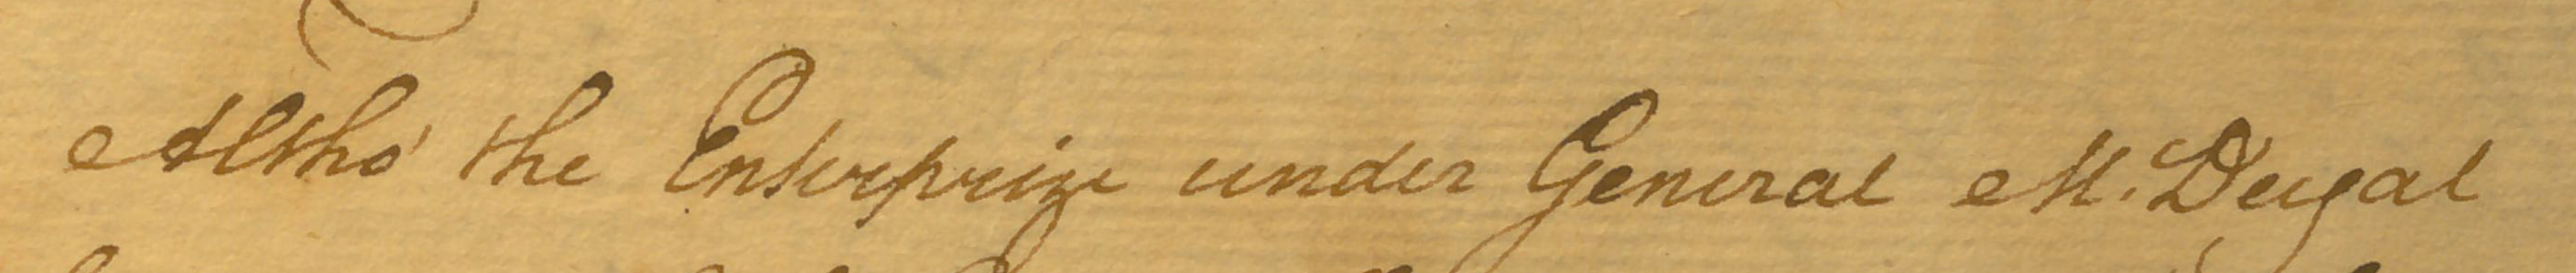Altho' the Enterprize under General M^cDugal
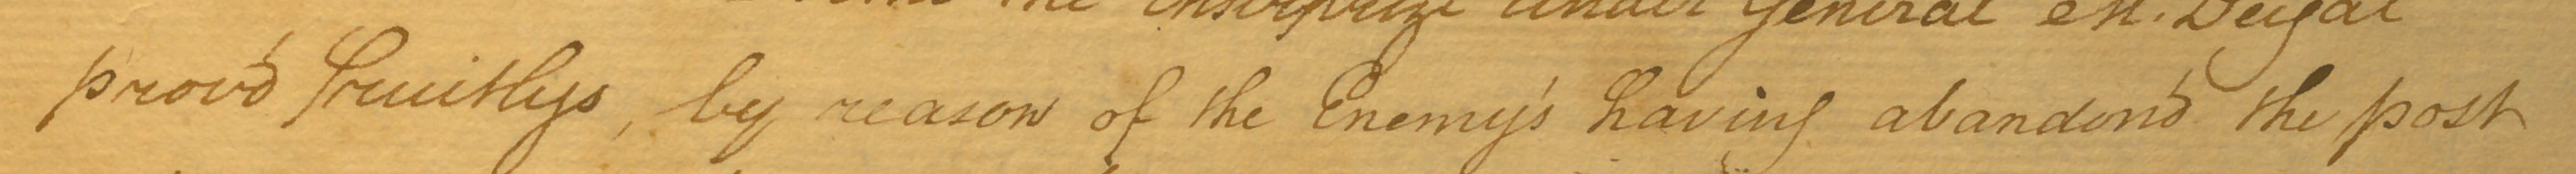prov'd fruitless, by reason of the Enemy's having abandon'd the post
